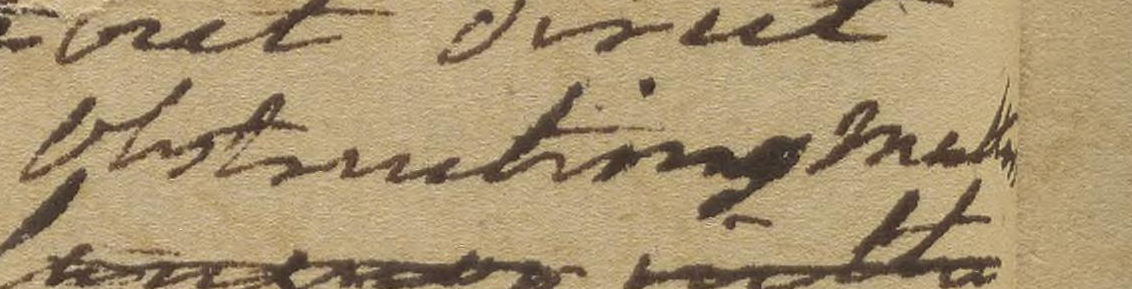obstructing matters
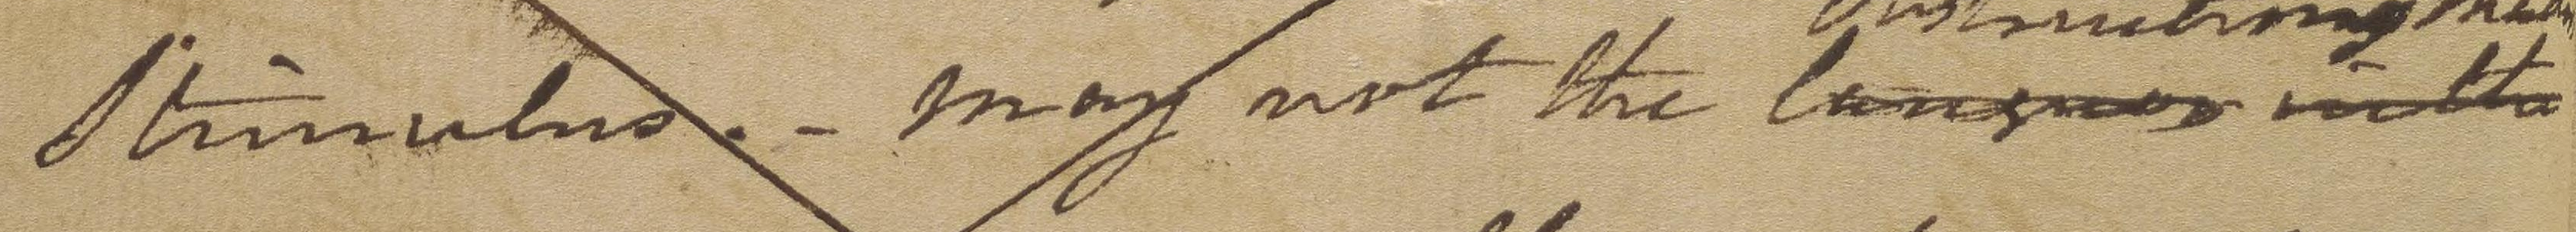Stimulus. May not the [languor]
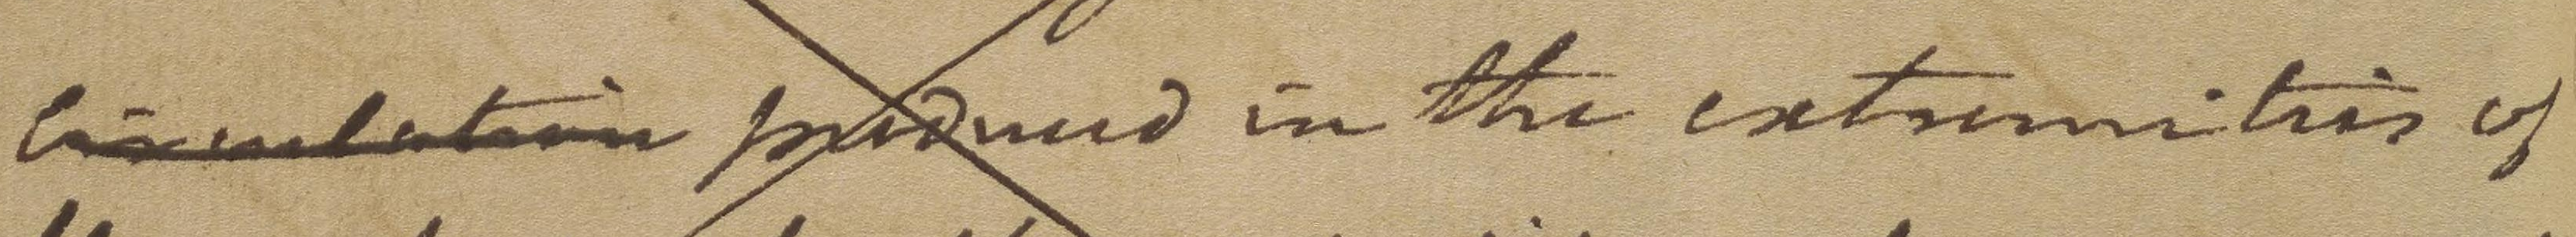[circulation] produced in the extremities of
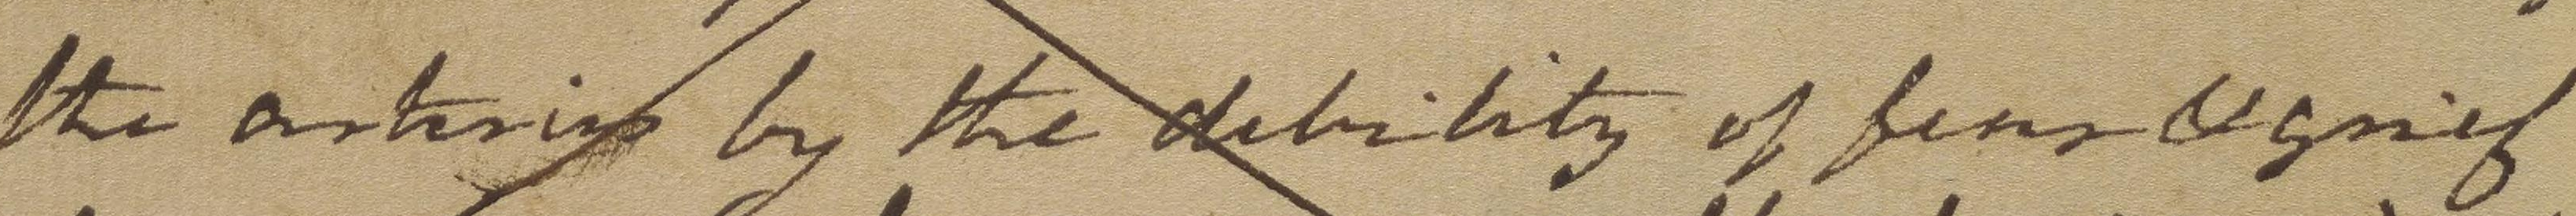the arteries by the debility of fear & grief
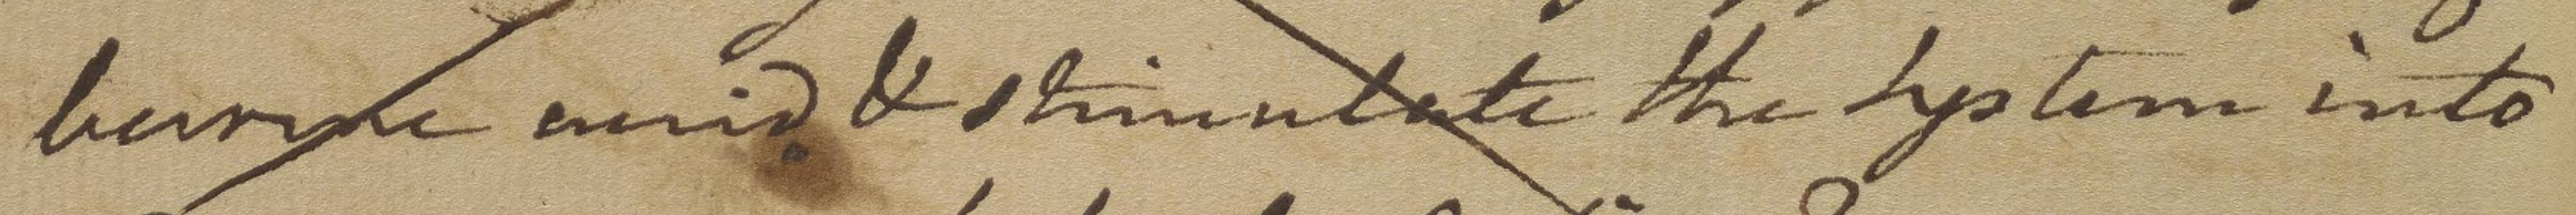become arid & stimulate the system into
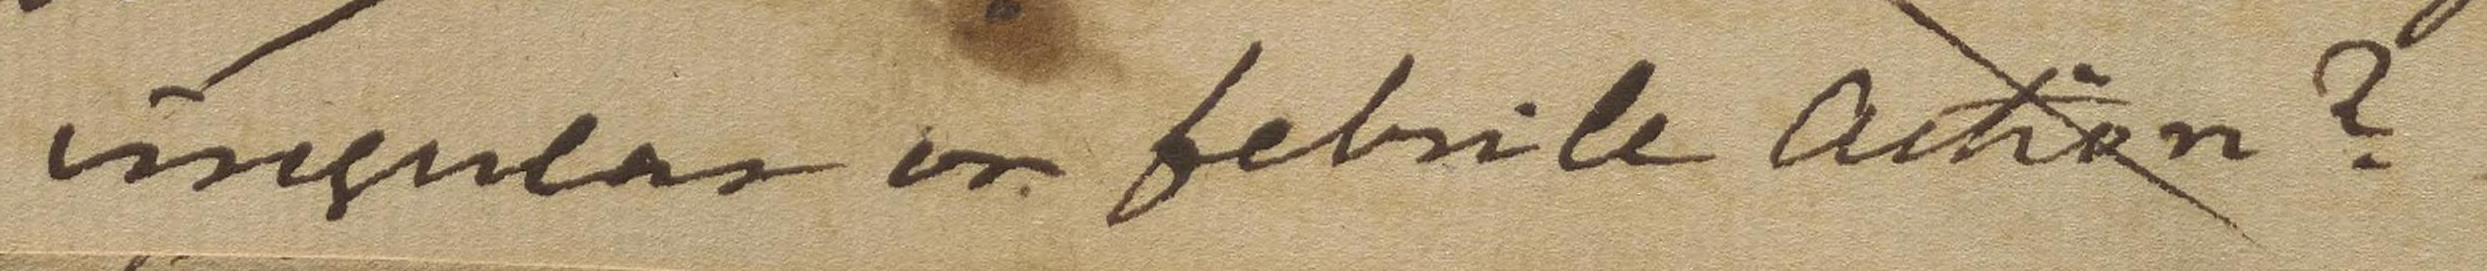irregular or febrile action?
